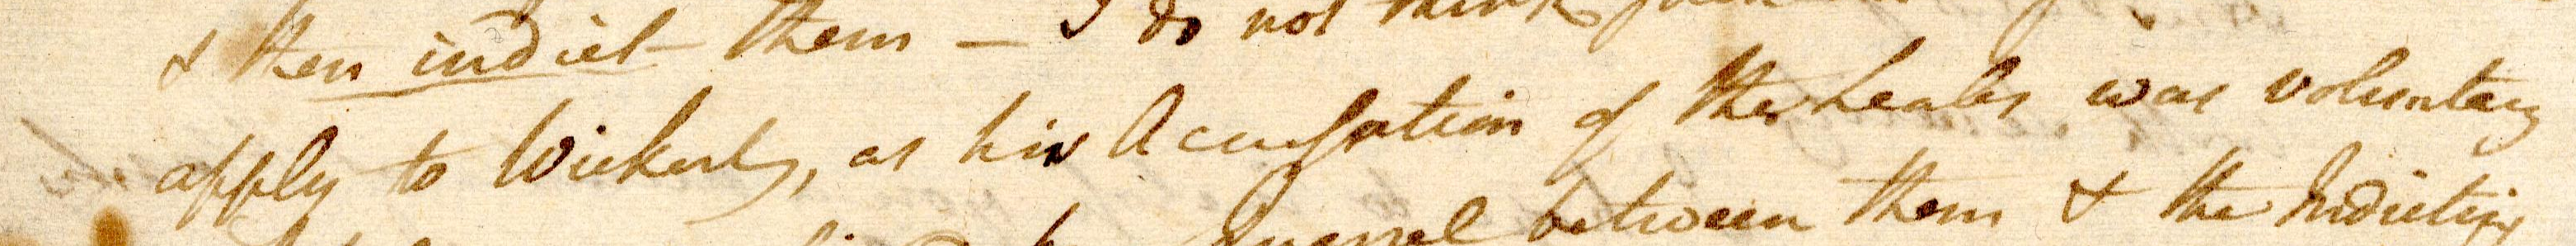apply to Wickert, as his Accusation of the Leabs was voluntary
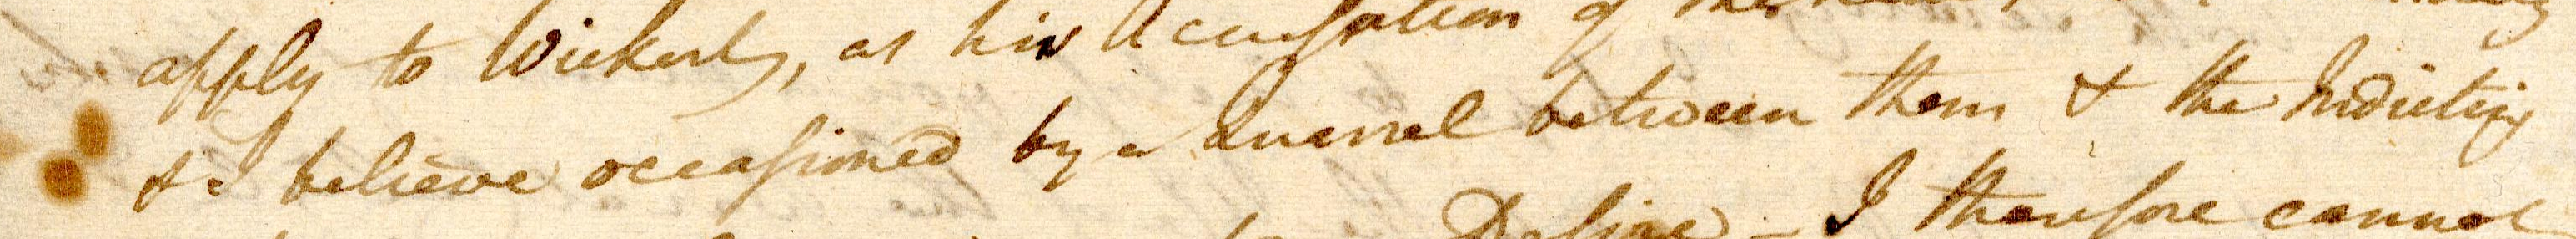& I believe occasioned by a Quarrel between them & the Indicting
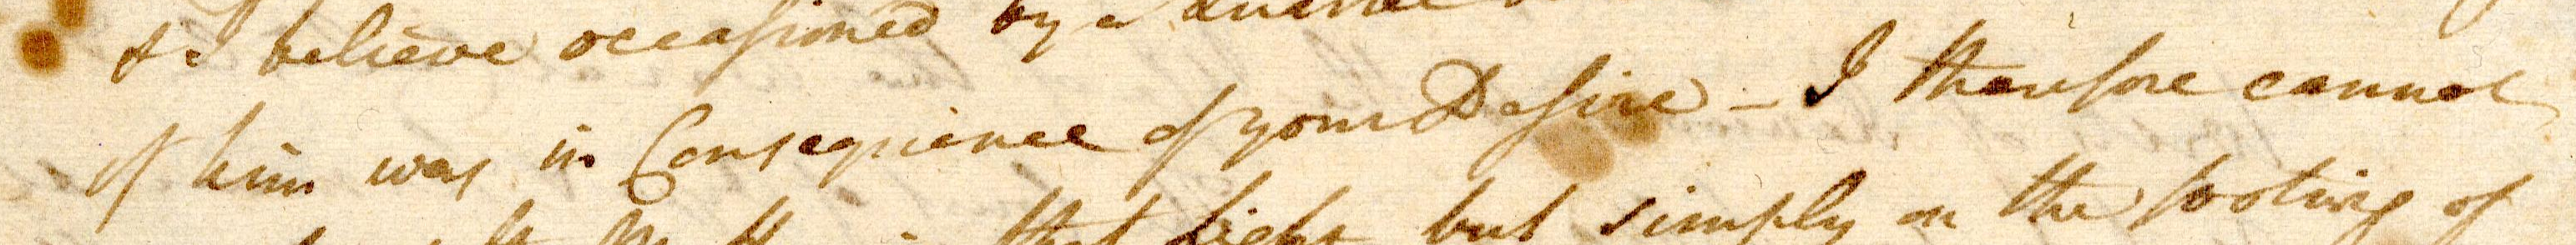of him was in Consequence of your Desire. I therefore cannot
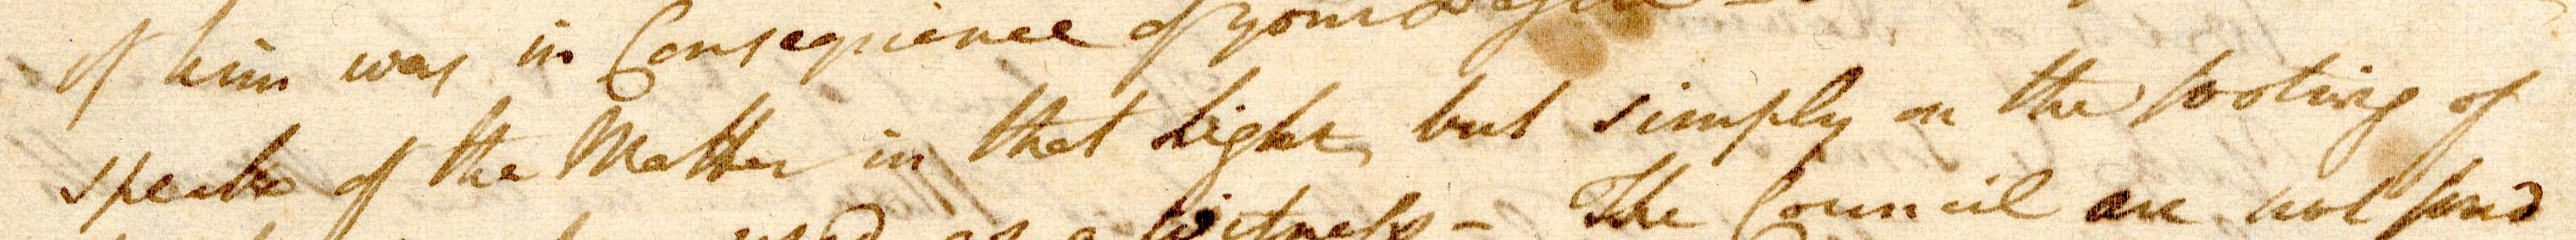speak of the Matter in that light, but simply on the footing of
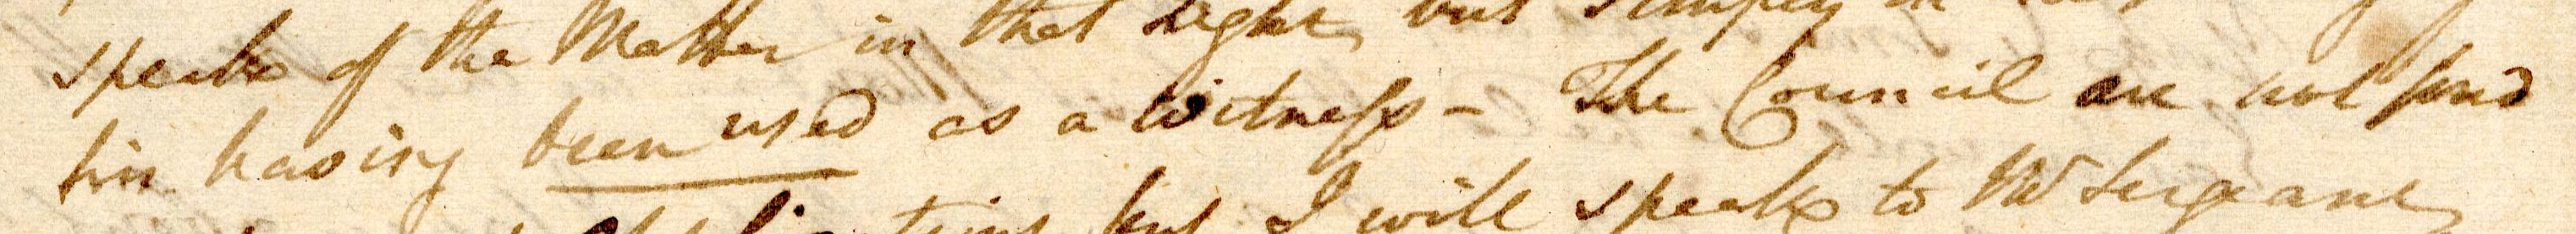him having been used as a Witness. The Council are not fond
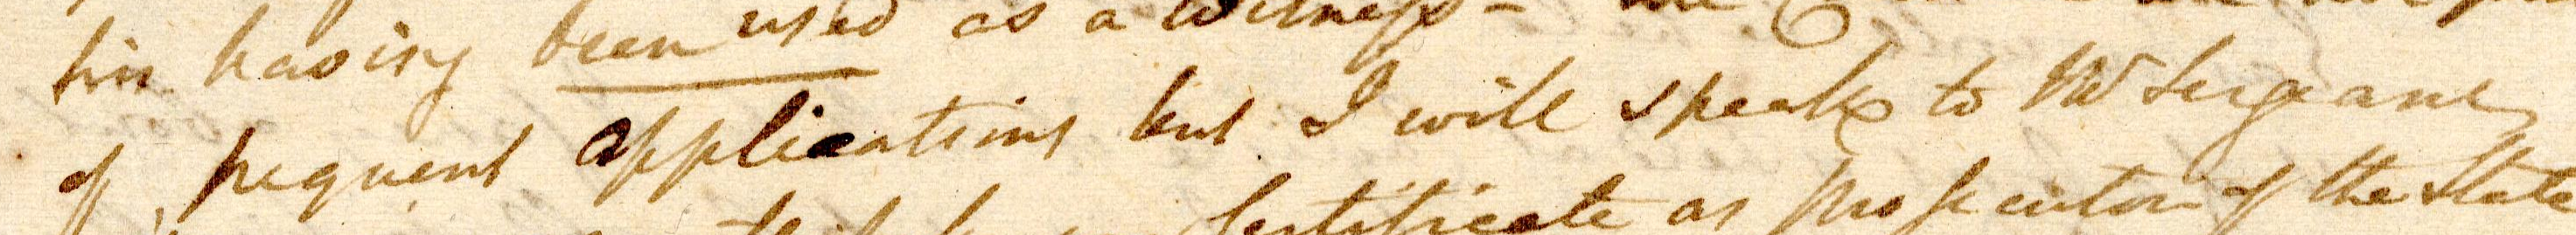of frequent Applications but I will speak to M^r Sergant
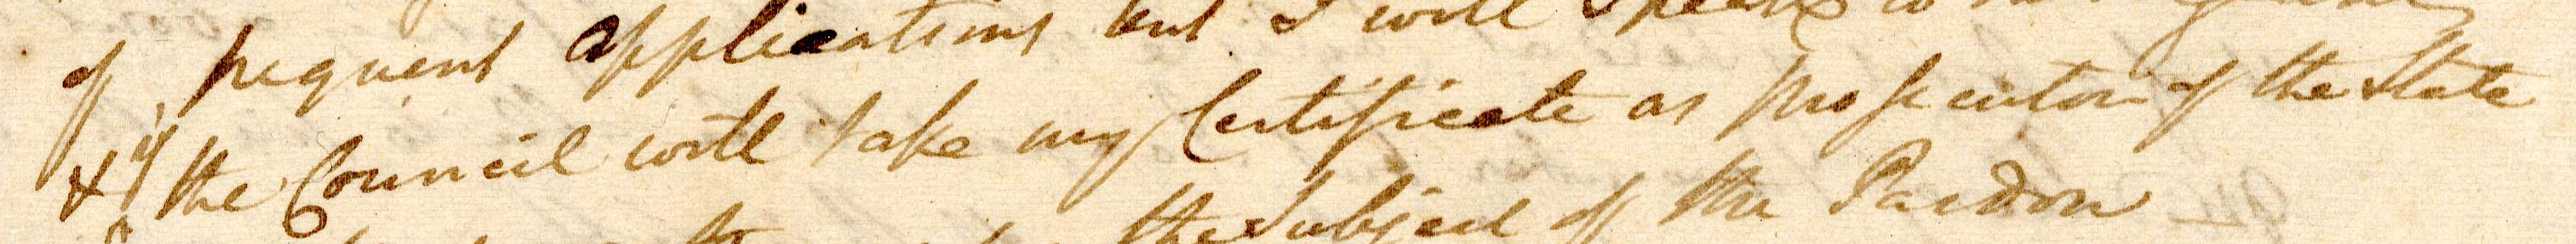& if the Council will take my Certificate as prosecutor of the state
